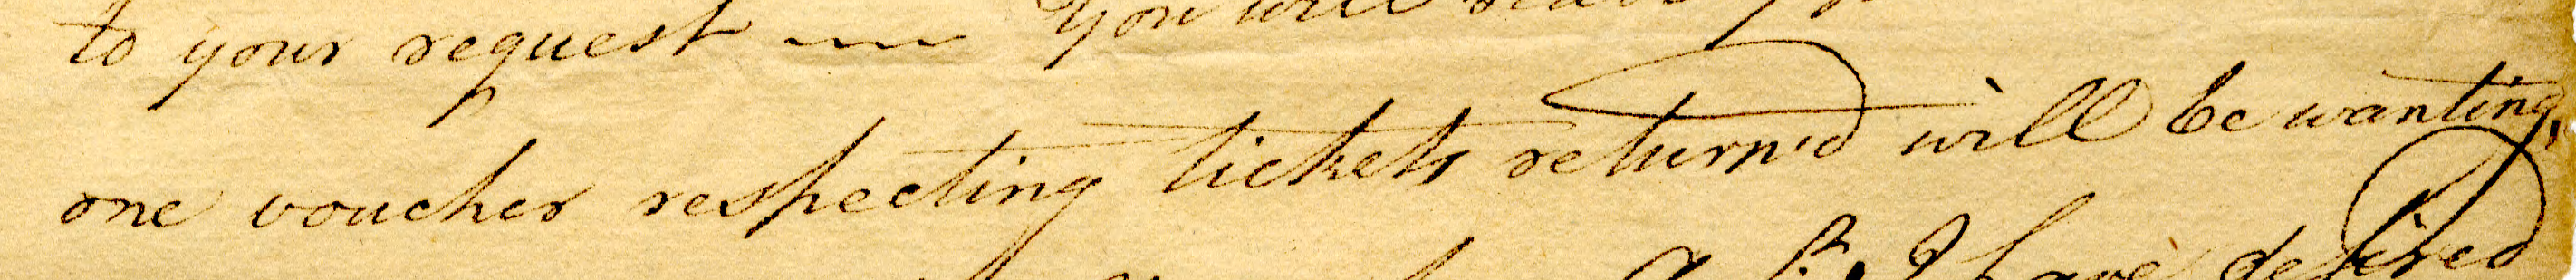one voucher respecting tickets return'd will be wanting,
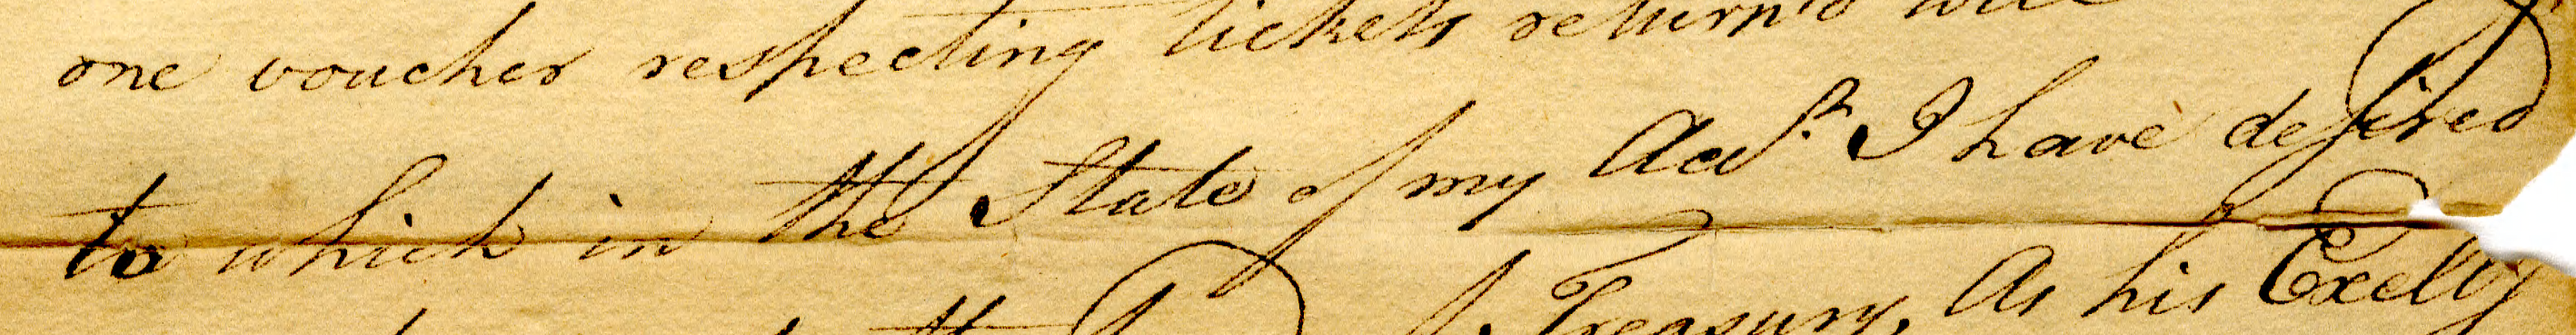to which in the State of my Acc^t. I have desired
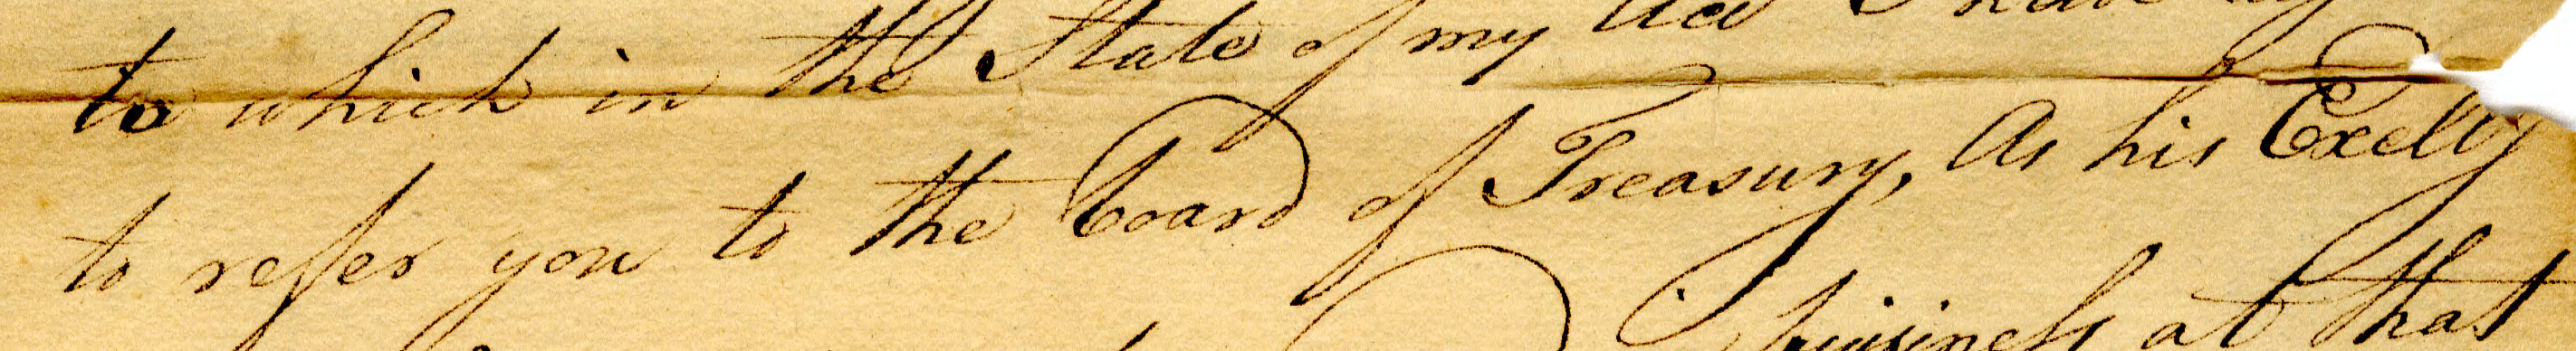to refer you to the board of Treasury as his Exelly
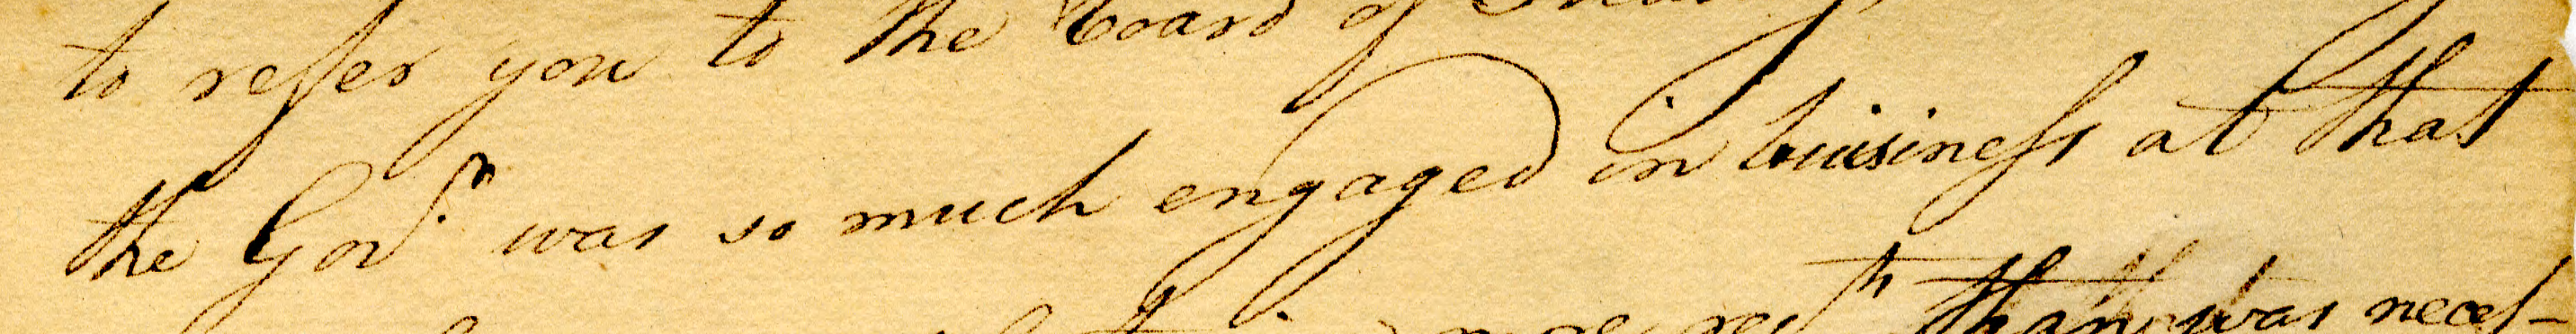the Gov^r. was so much engaged in business at that
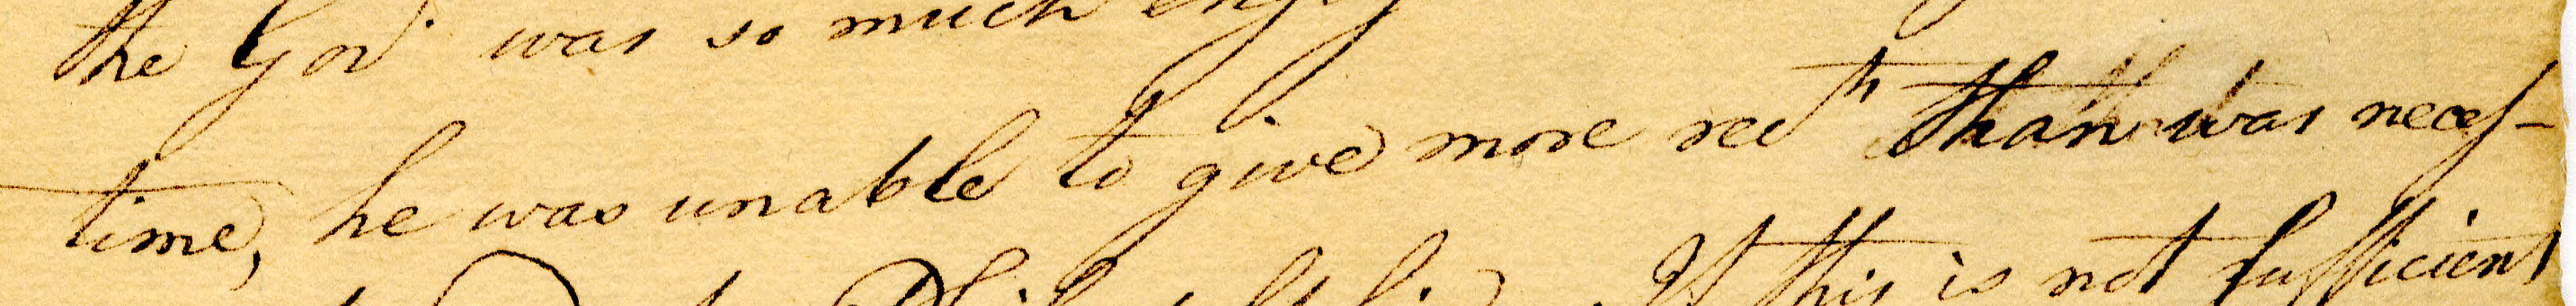time, he was unable to give more rec^t than was neces-
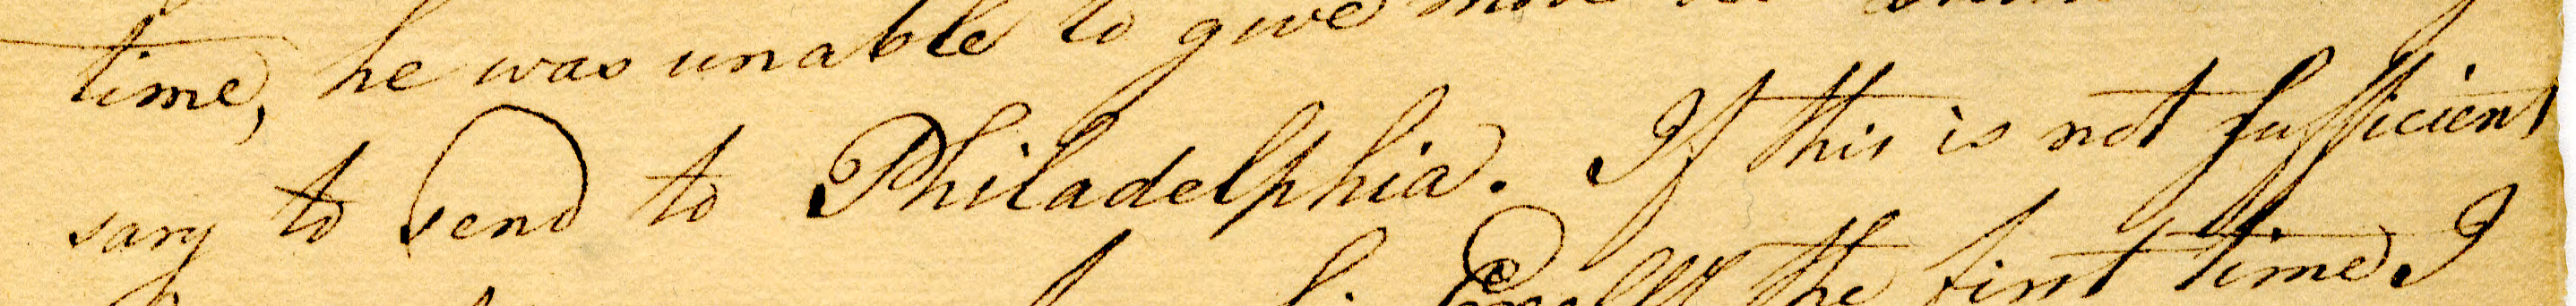sary to send to Philadelphia. If this is not sufficient
